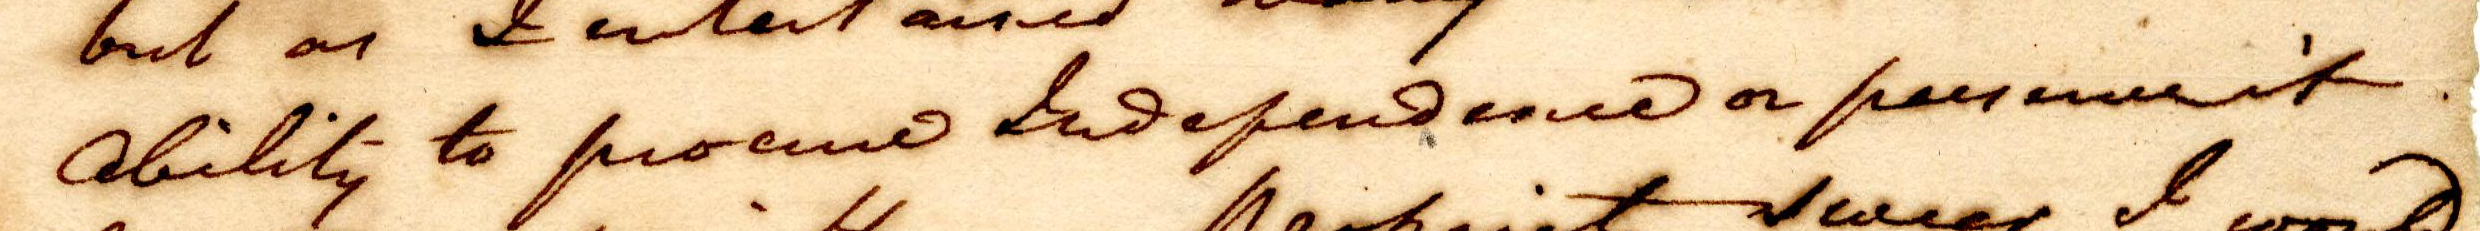Ability to procure Independence or preserve it
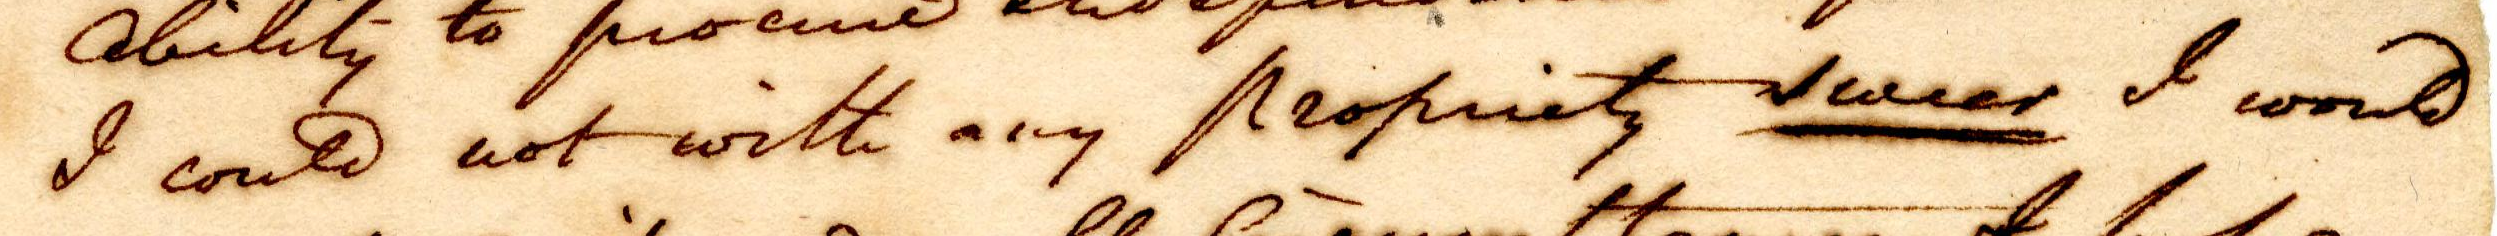I could not with any propriety swear I would
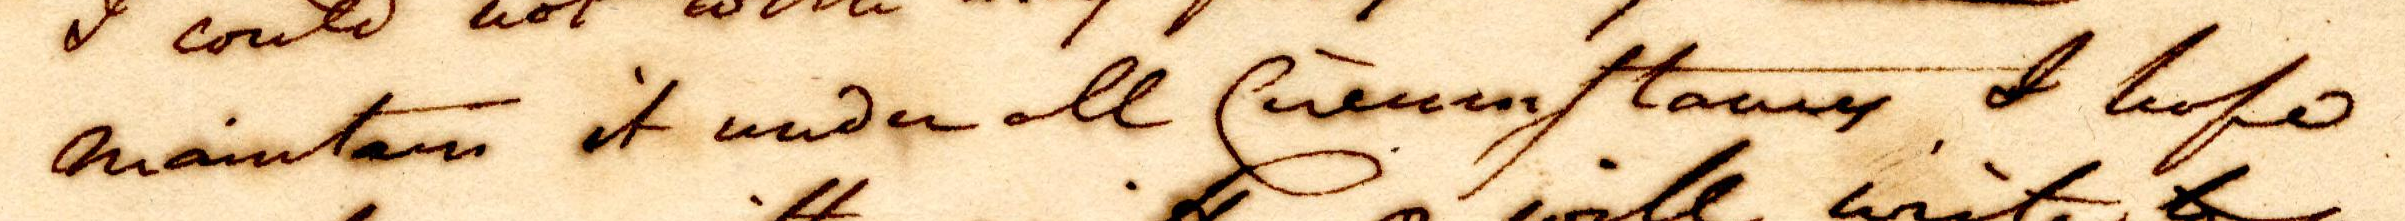maintain it under all Circumstances. I hope
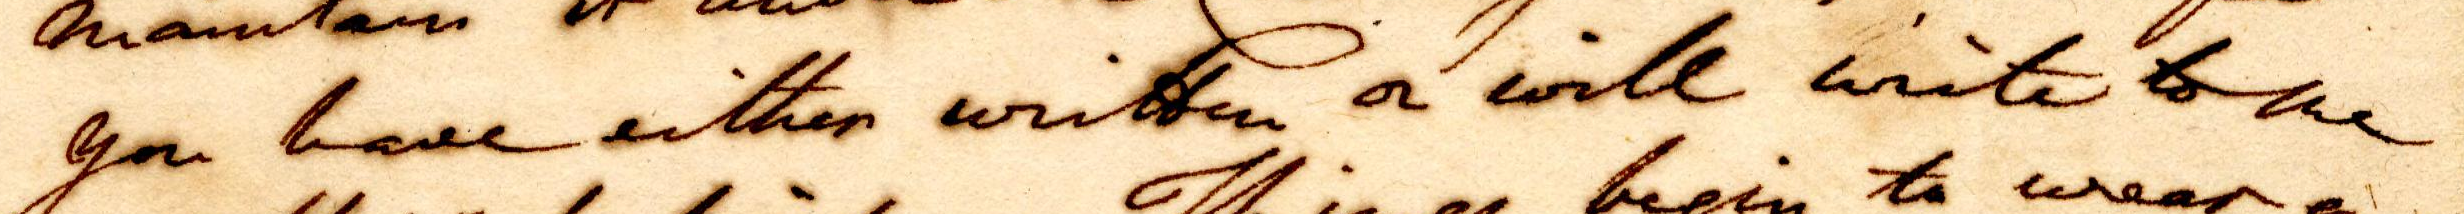you have either written or will write to me
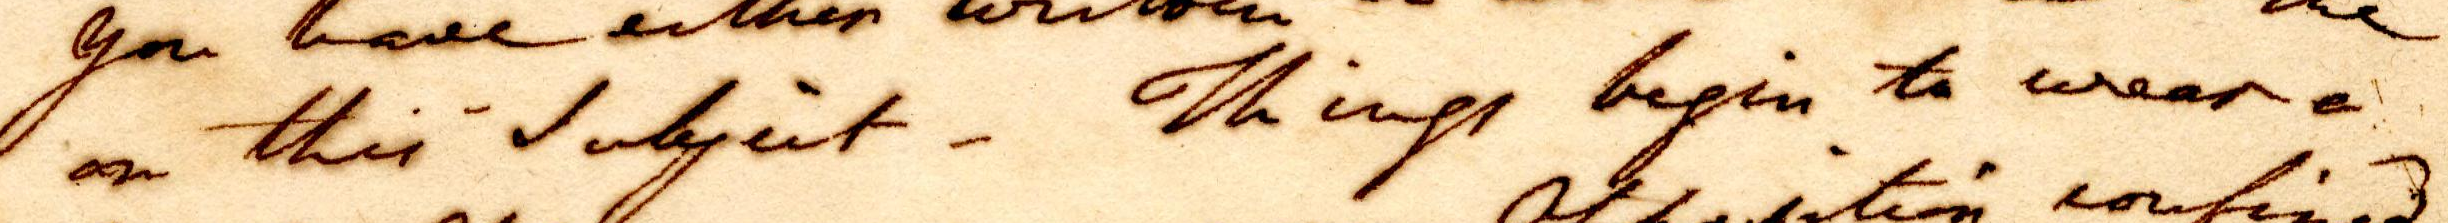on this Subject. Things begin to wear a
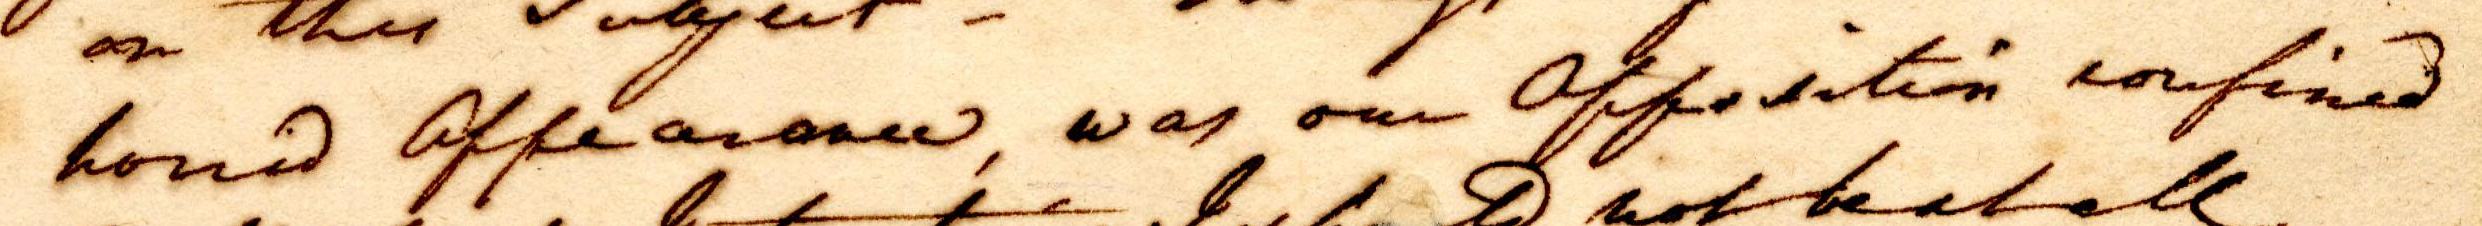horrid Appearance, was our Opposition confined
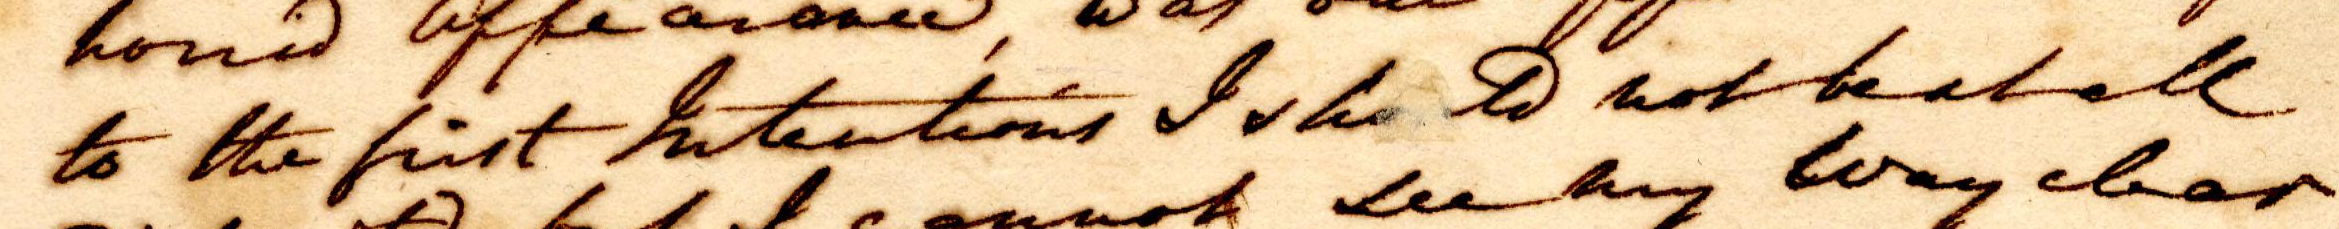to the first Intentions I should not be at all
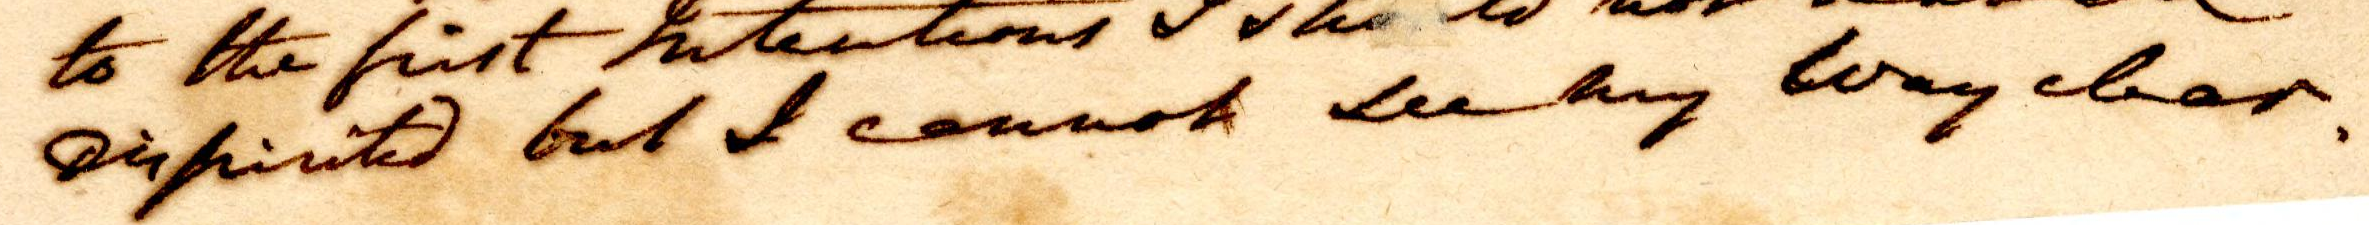dispirited but I cannot see any way clear.
